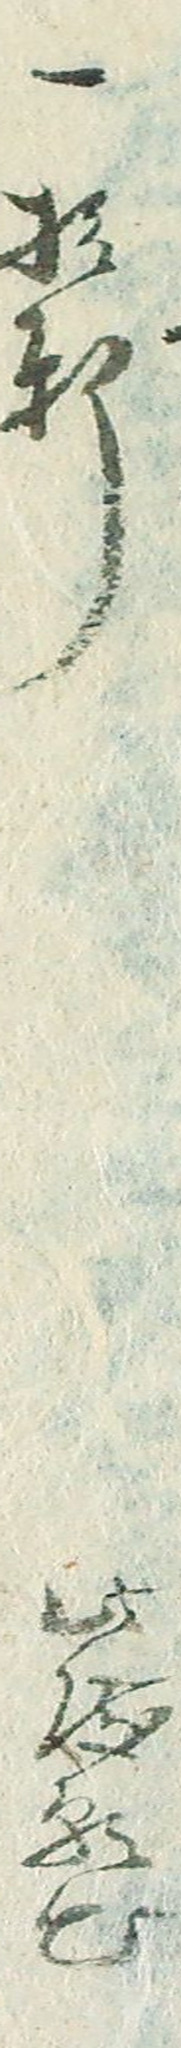一拾軒此度願出
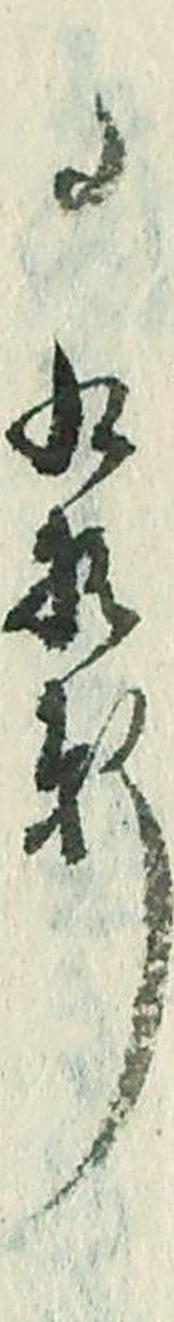〆九拾軒
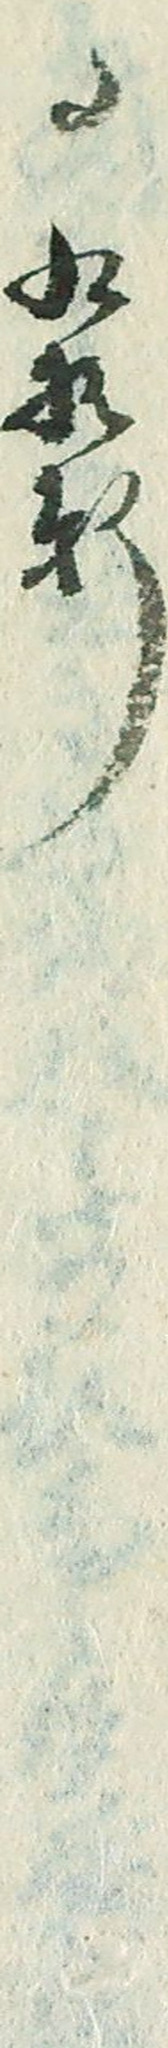〆九拾軒
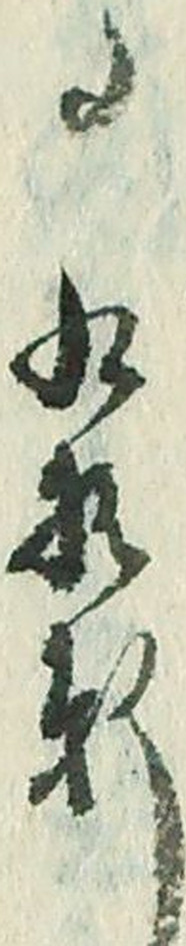〆九拾軒
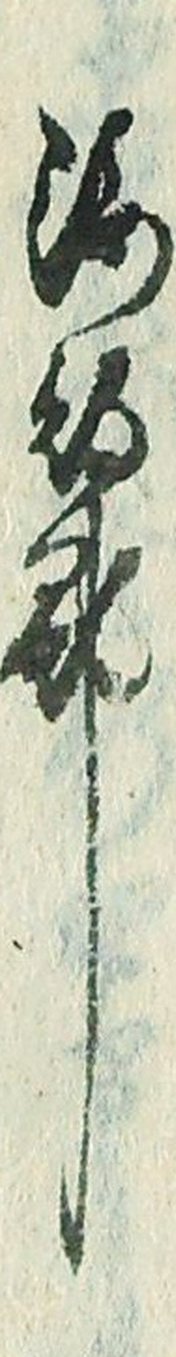海部郡
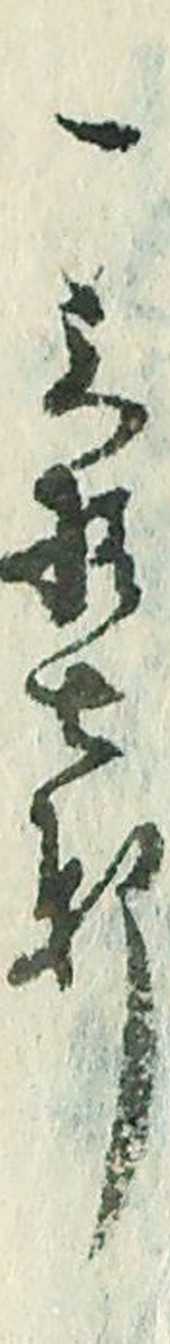〆三拾九軒
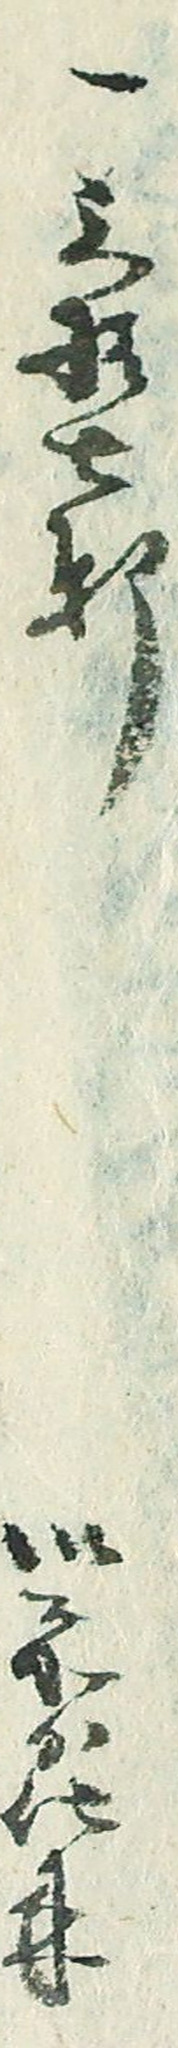一三拾七軒以前ゟ仕来
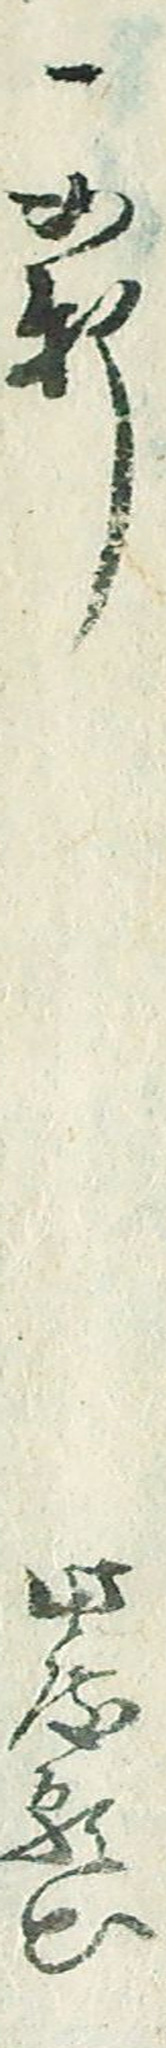一弐軒此度願出
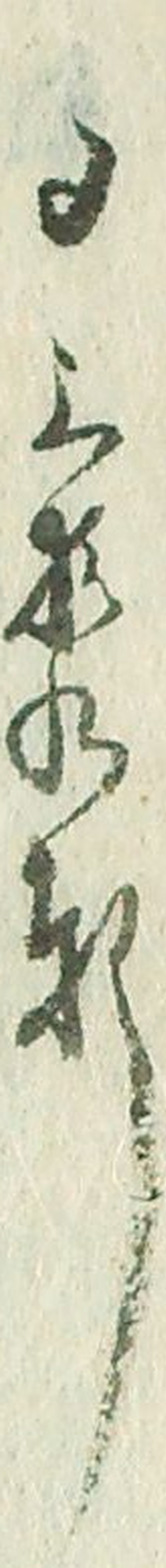〆三拾九軒
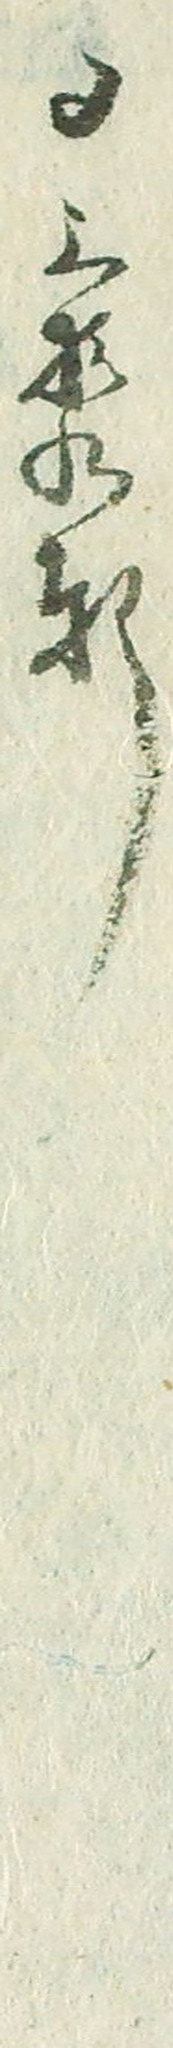〆三拾九軒
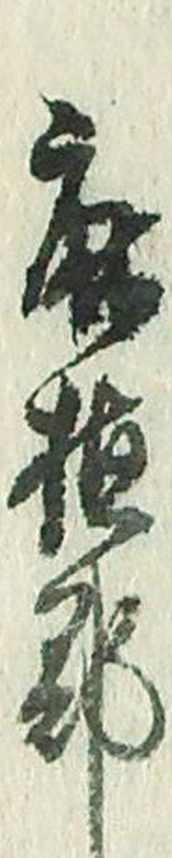麻植郡
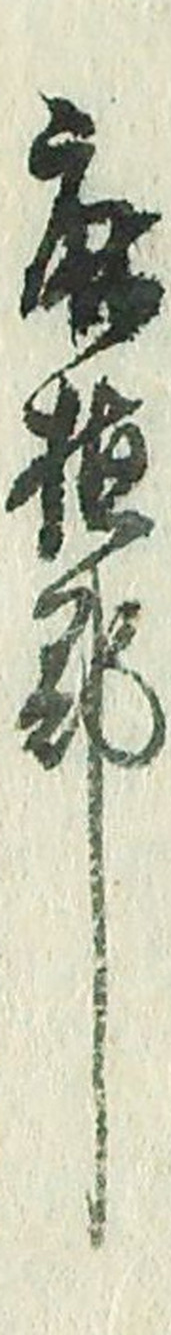麻植郡
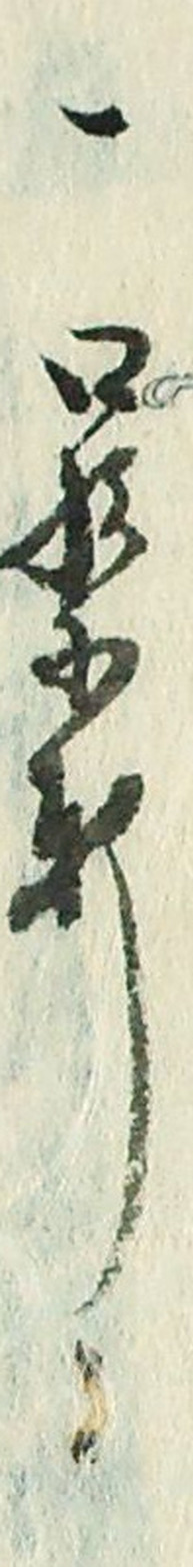〆七拾五軒
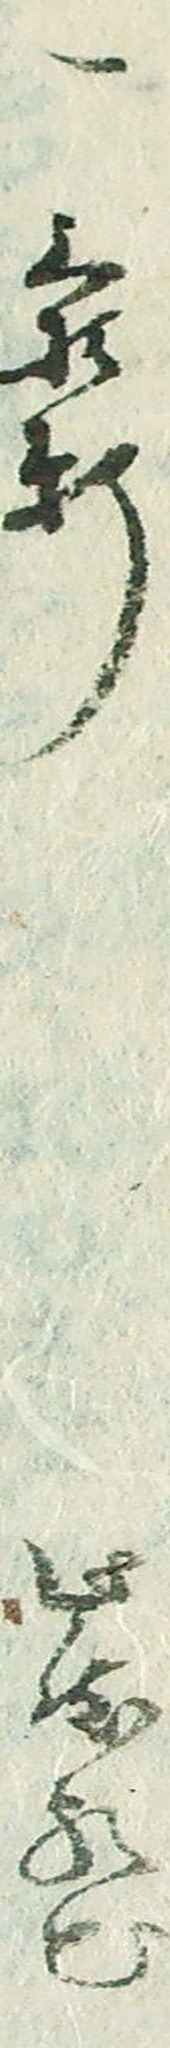一三拾軒此度願出
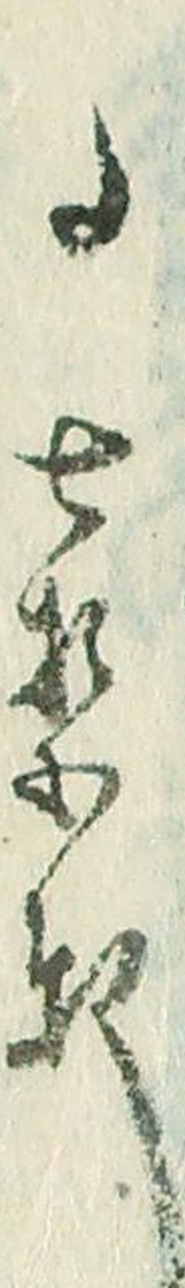〆七拾五軒
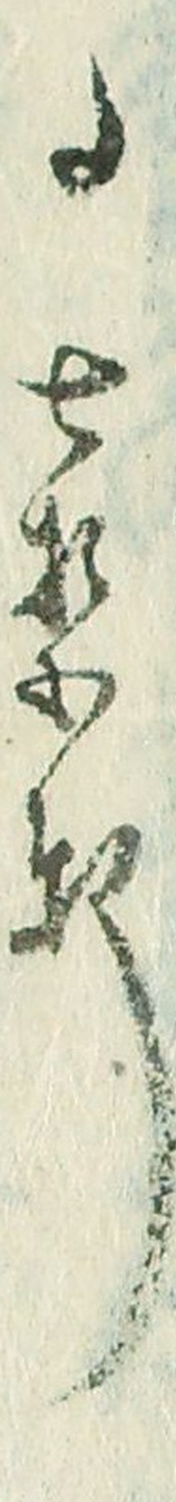〆七拾五軒
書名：市郷質屋株御取究並御書出御趣法之写
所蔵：鳴門教育大学 Naruto University of Education
